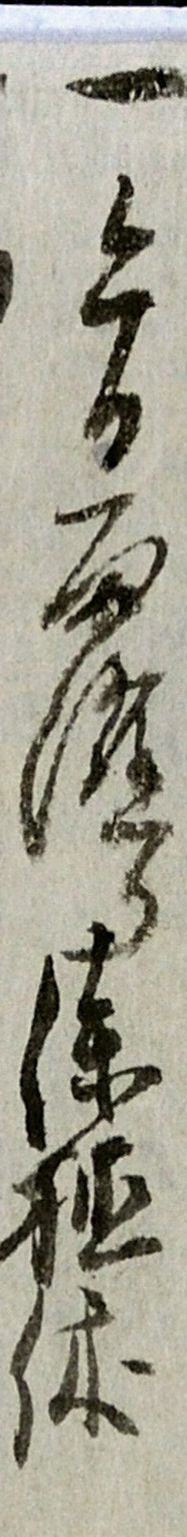一今日雨降り漆植休
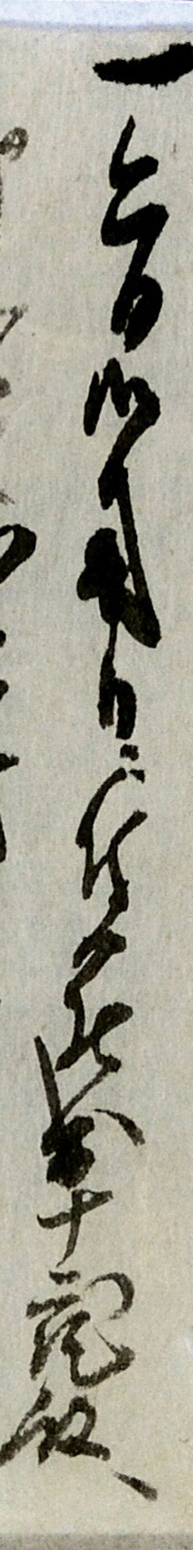一今日御用日ニ付罷出十蔵殿へ
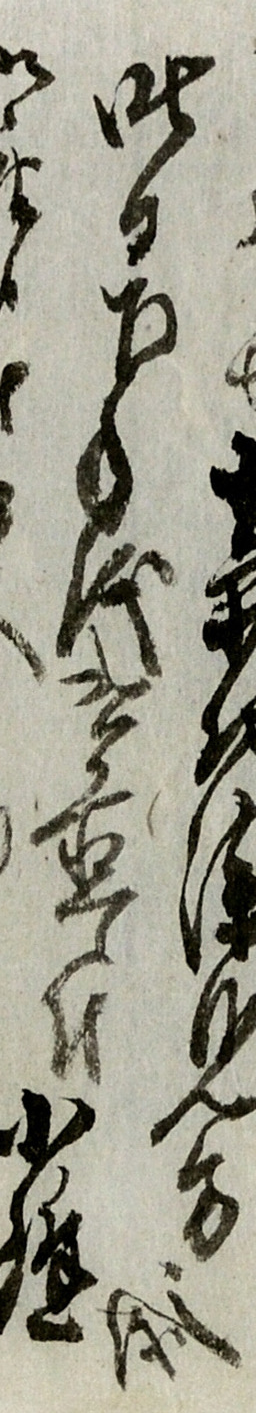昨日下手紙遣置候付小訴
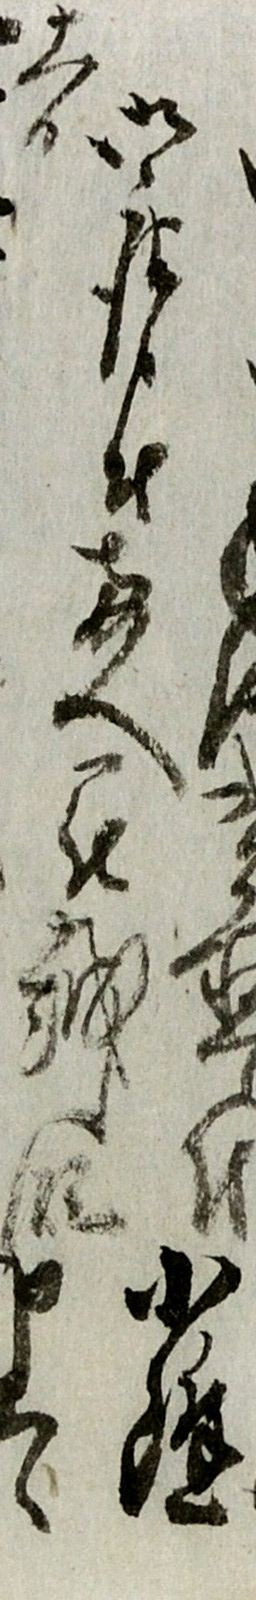御座候付両人罷越候段申上候
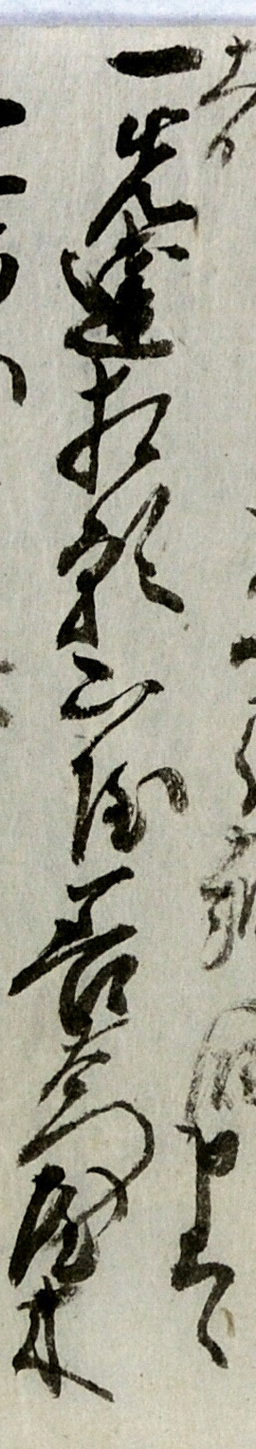一先達相願山屋善右衛門屋木
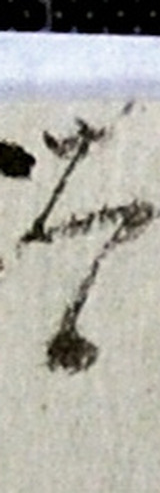十一日
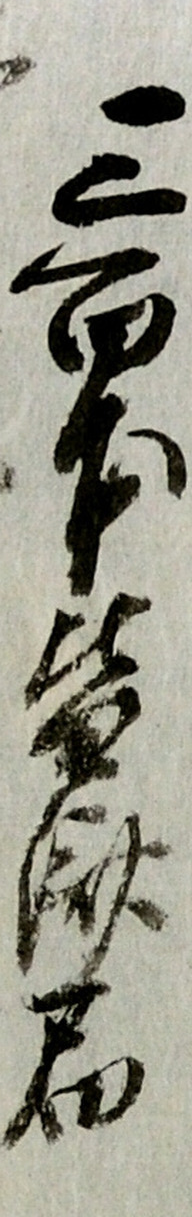三百本皆済届
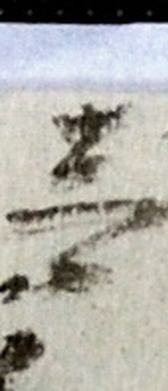十一日
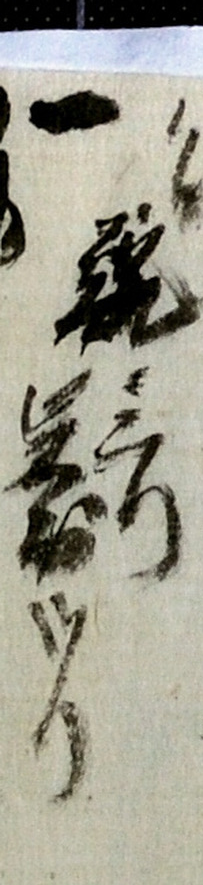一鯇三つ
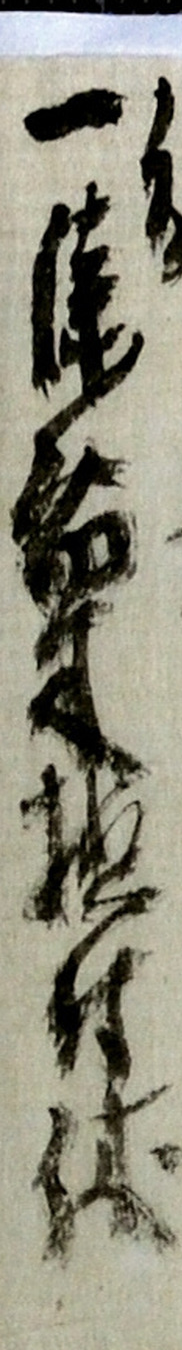一漆苗木植付休

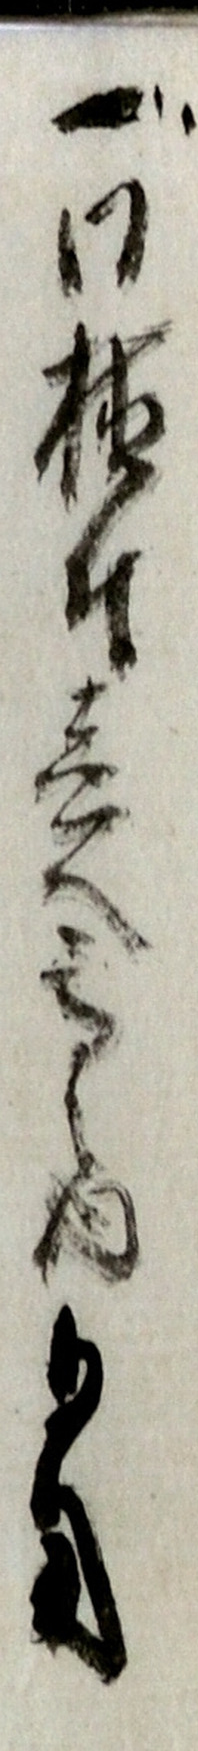一同植付壱人高之内御用
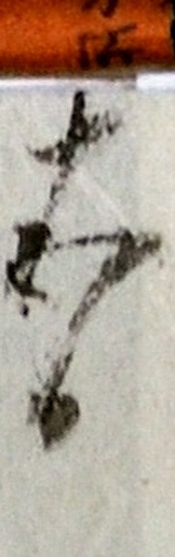十五日
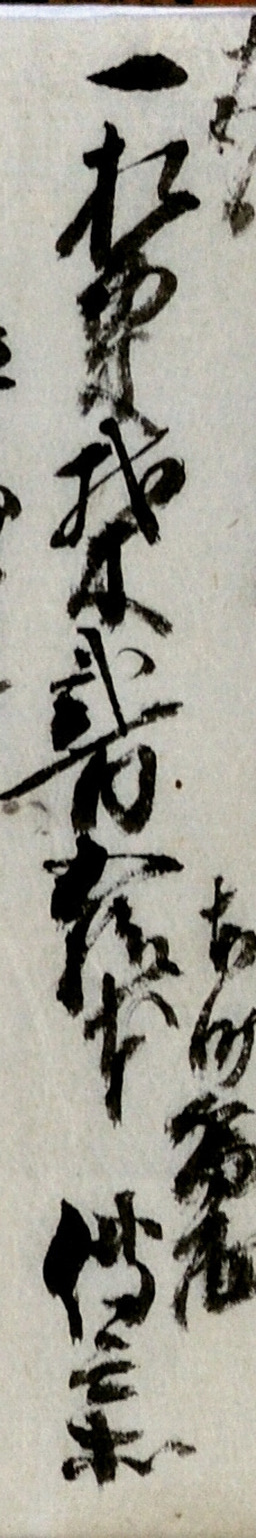一松栗材木弐百五拾本伝兵衛
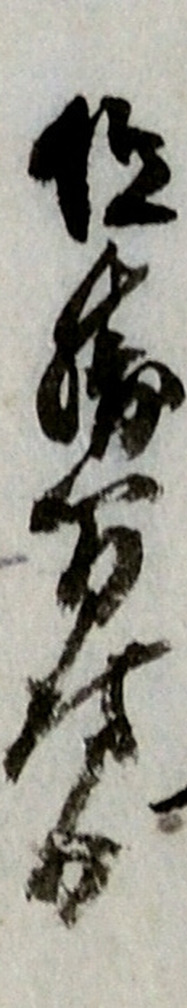但勝間村ゟ
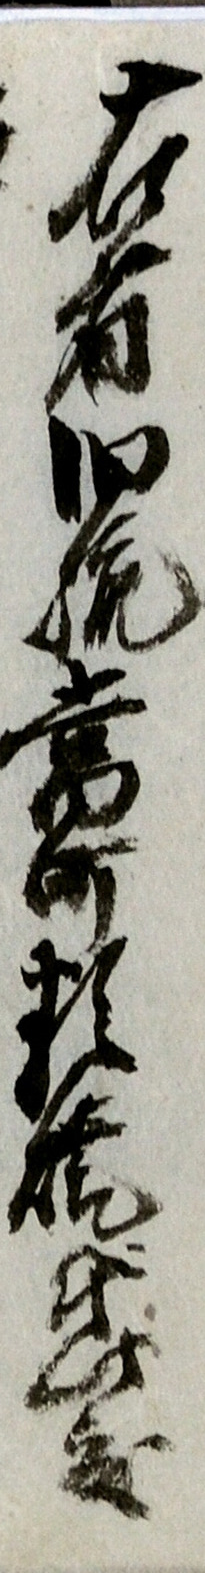右は旧臘当町類焼ニ付此度
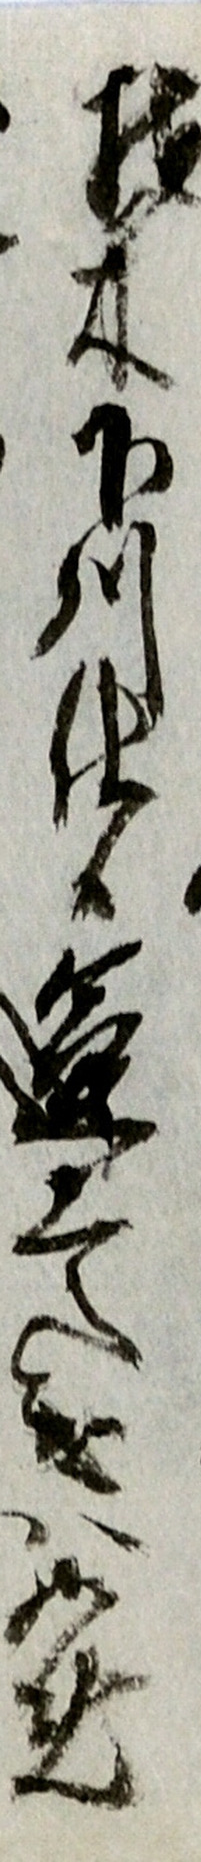材木下川仕候運上之義ハ御免
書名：分一方諸事御用留帳
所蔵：伊那市立高遠町図書館・合同会社AMANE
